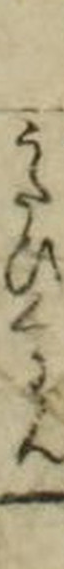うたひくわん
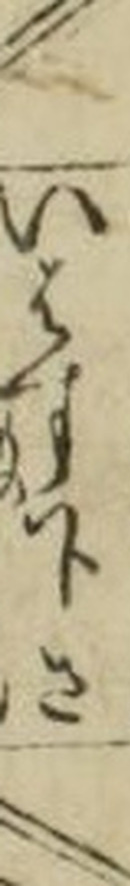いはす下さ
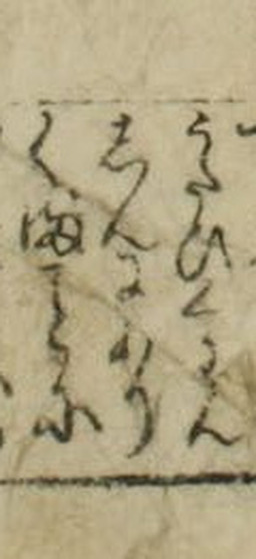しんにあり
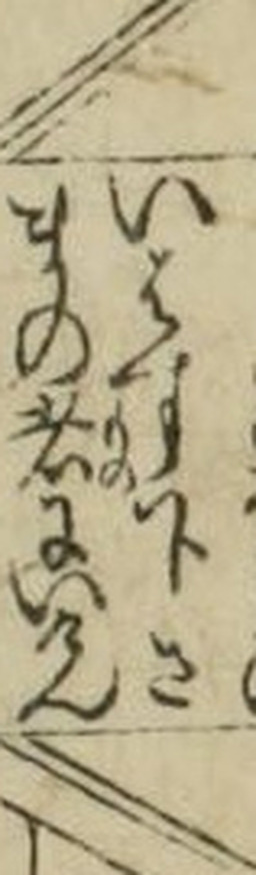まの者にいけん
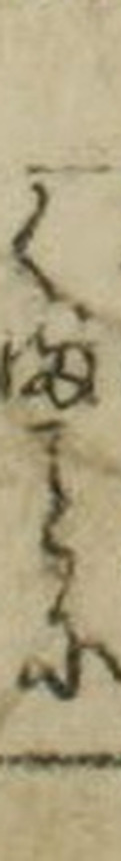くまことに
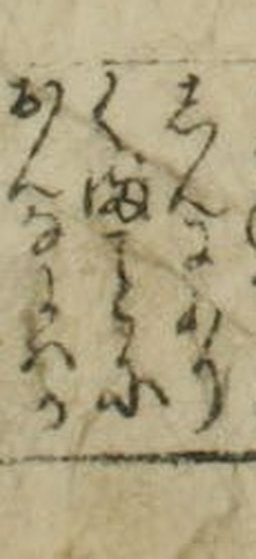くまことに
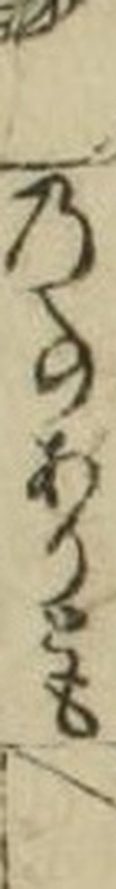の事ありとも
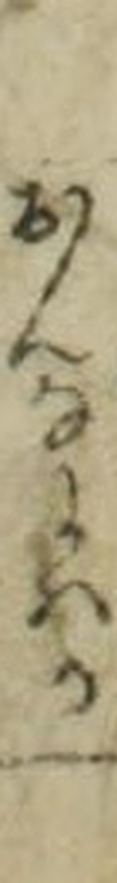おんなにはか
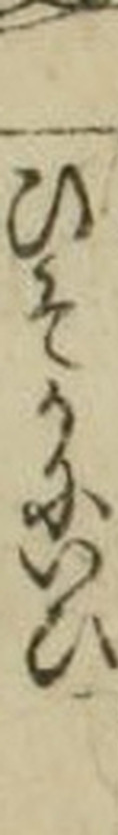ひそかにいひ
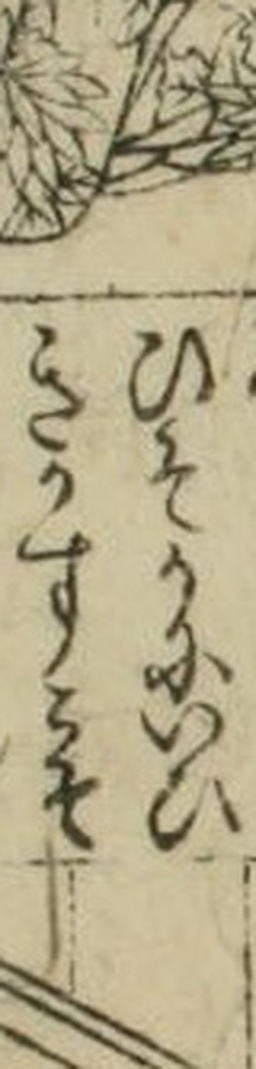きかすこそ
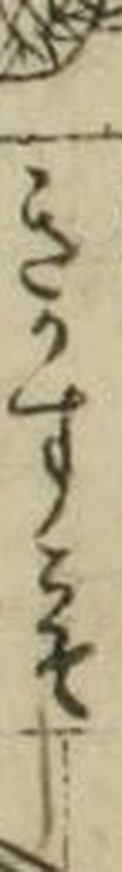きかすこそ
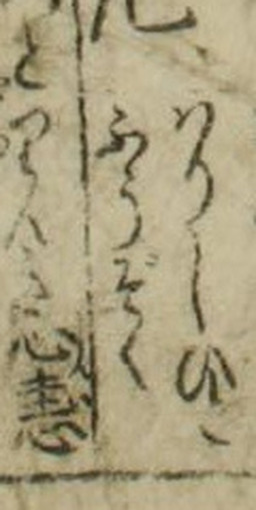ふうぞく
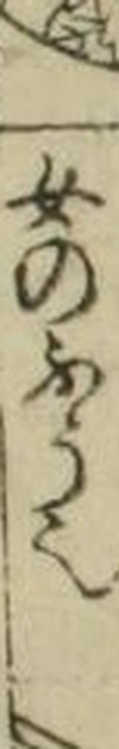女のふう也
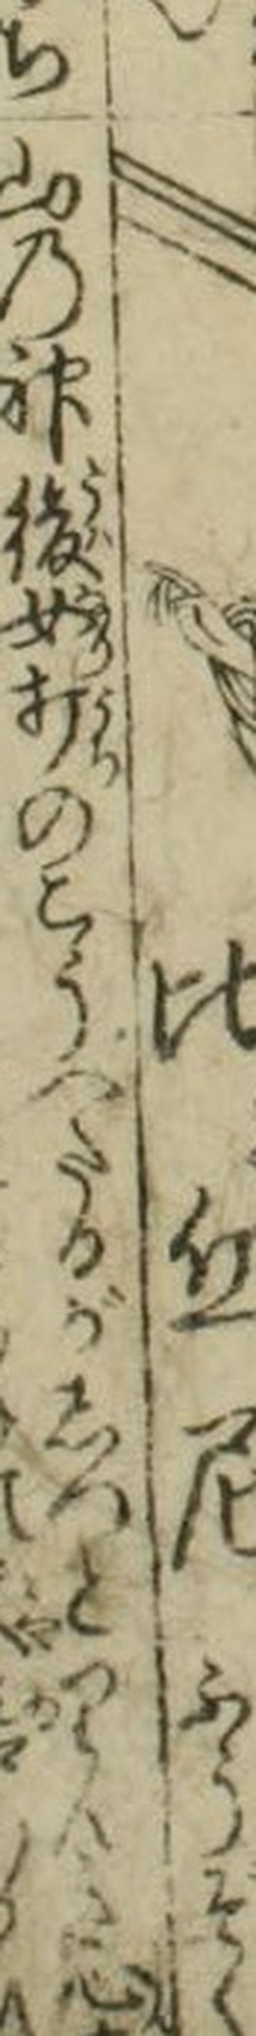山の神後女打のこうべたるがしつとりんき心恚
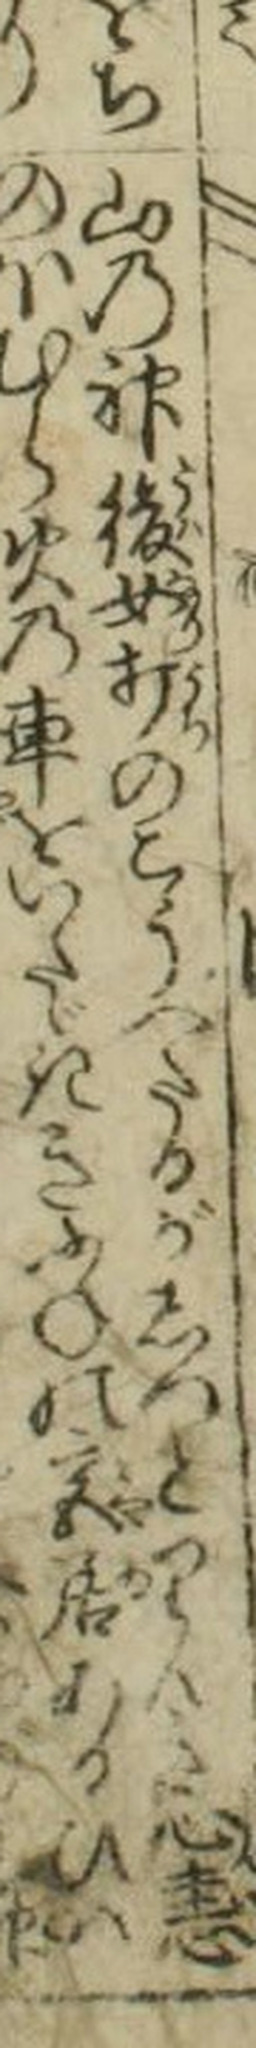のほむら火の車をいたゞききふねの宮居あるひは
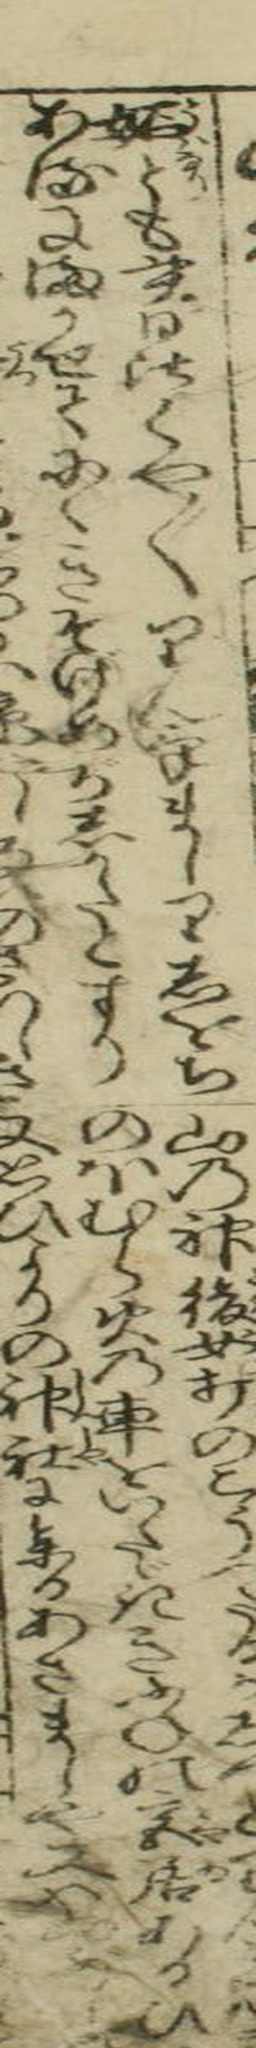あるにまかせてにくきそげめがしかたとすり
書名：女源氏教訓鑑
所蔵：東京学芸大学附属図書館
